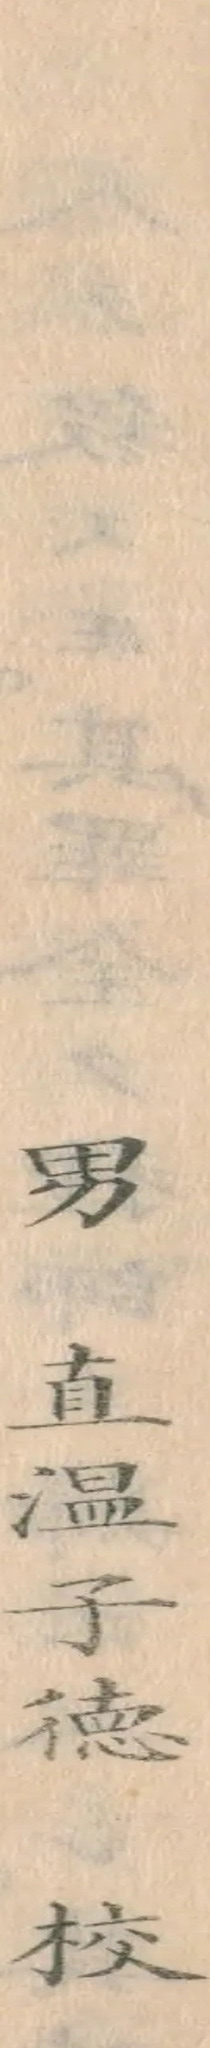男直温子徳校
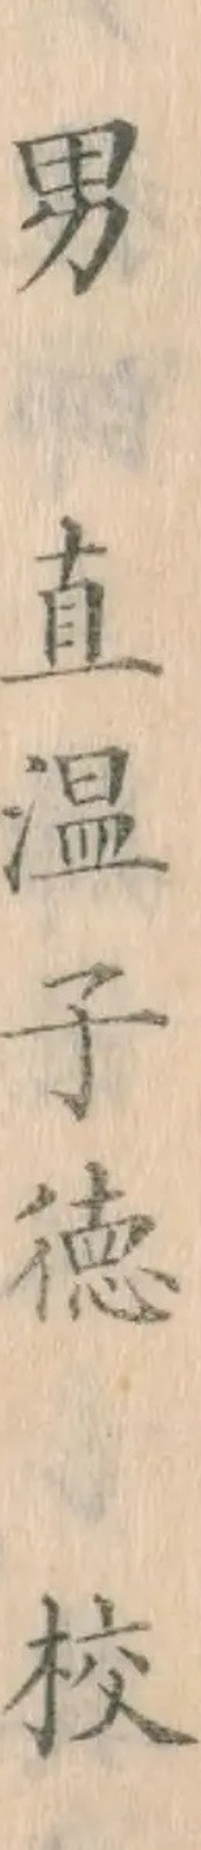男直温子徳校
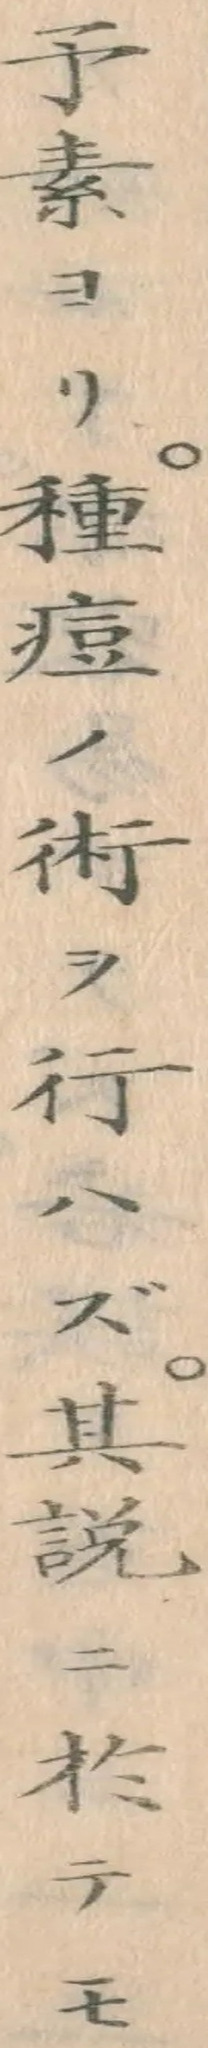予素ヨリ。。種痘ノ術ヲ行ハズ。其説ニ於テモ
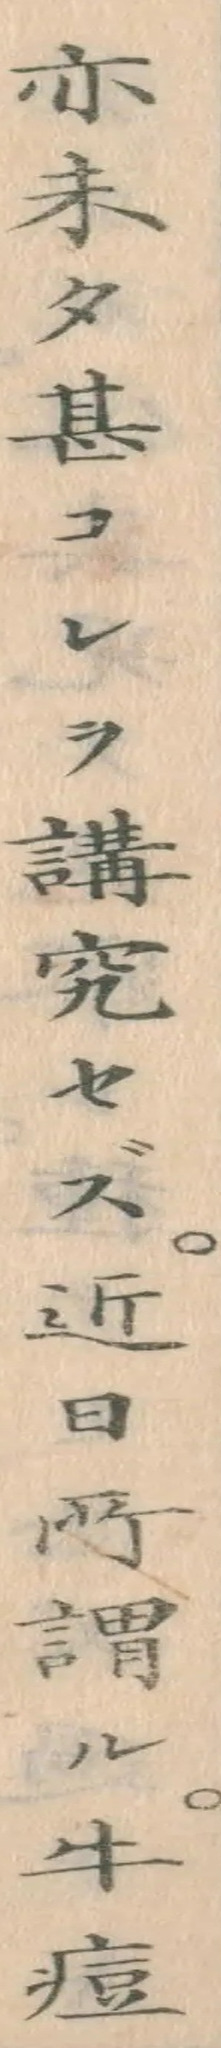亦未タ甚コレヲ講究セズ。近日所謂ル。牛痘
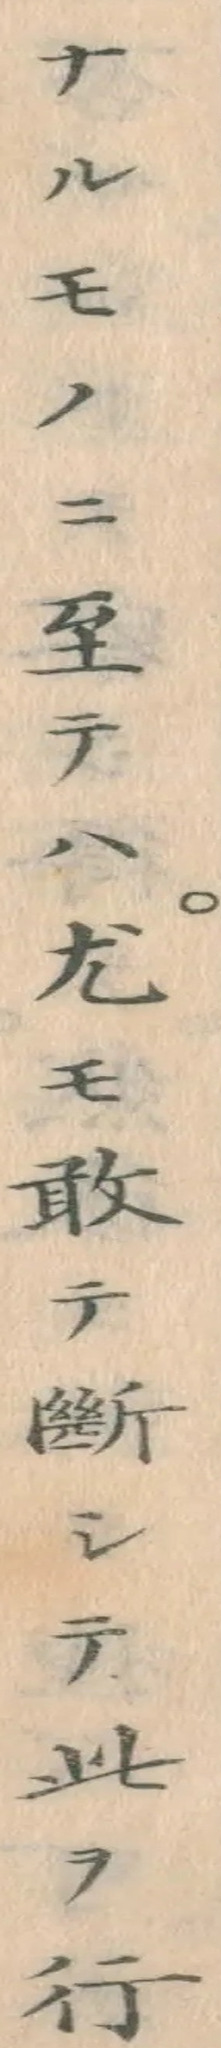ナルモノニ至テハ。尤モ敢テ断シテ此ヲ行
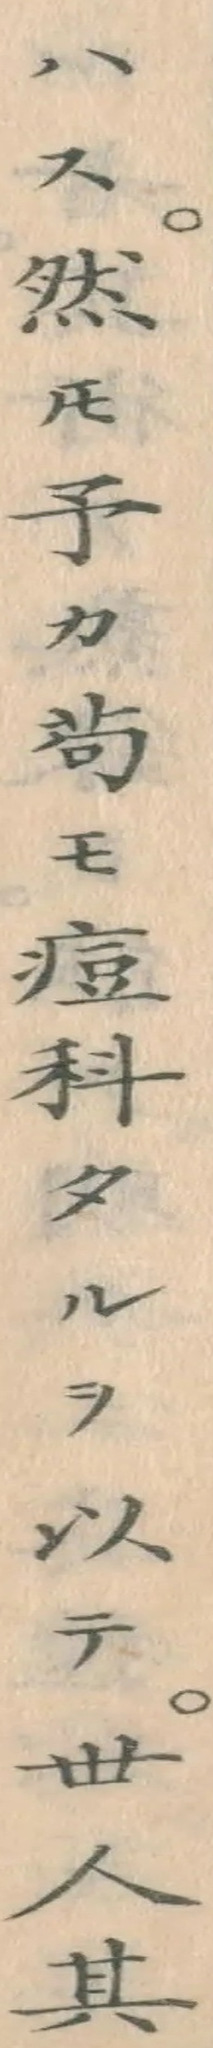ハス。然𪜈予カ苟モ痘科タルヲ以テ。世人其
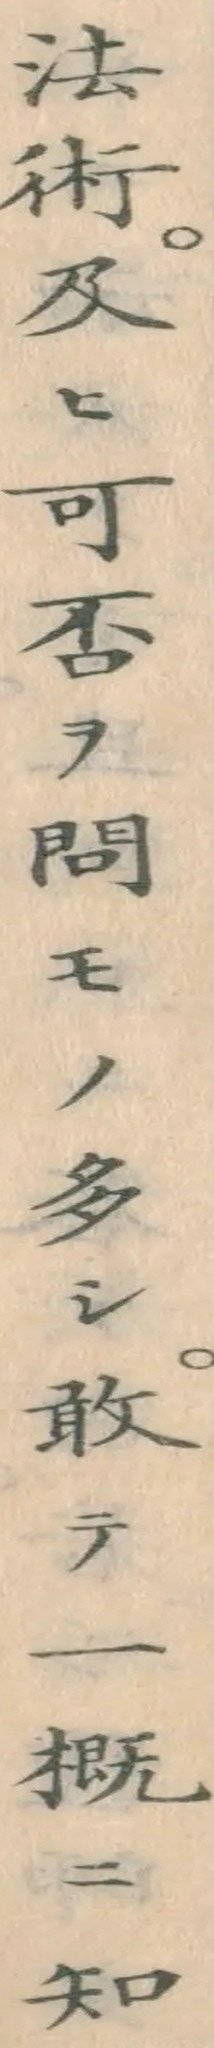法術。及ヒ可否ヲ問モノ多シ。敢テ一概ニ知
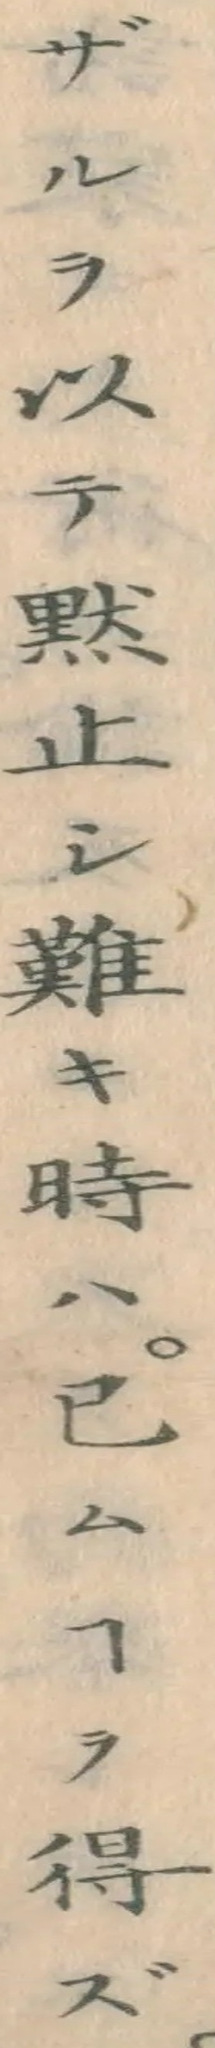ザルヲ以テ黙止シ難キ時ハ。已ムヿヲ得ズ。

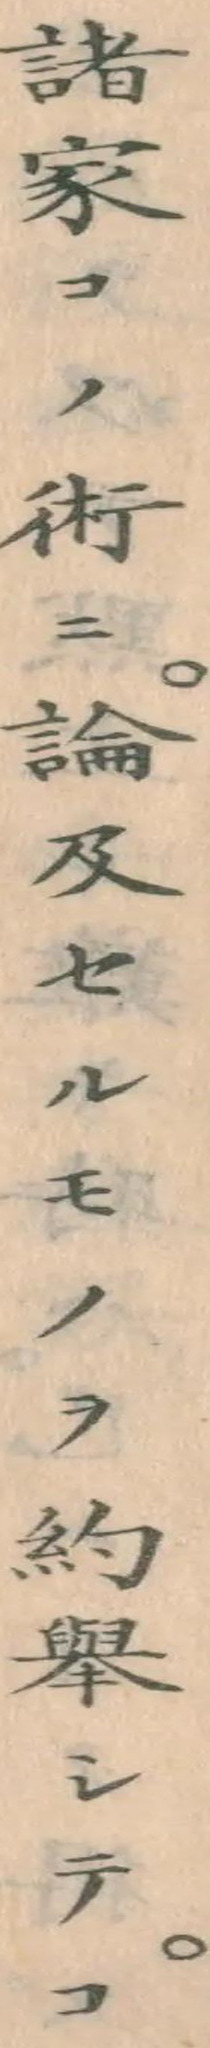諸家コノ術ニ。論及セルモノヲ約挙シテ。コ
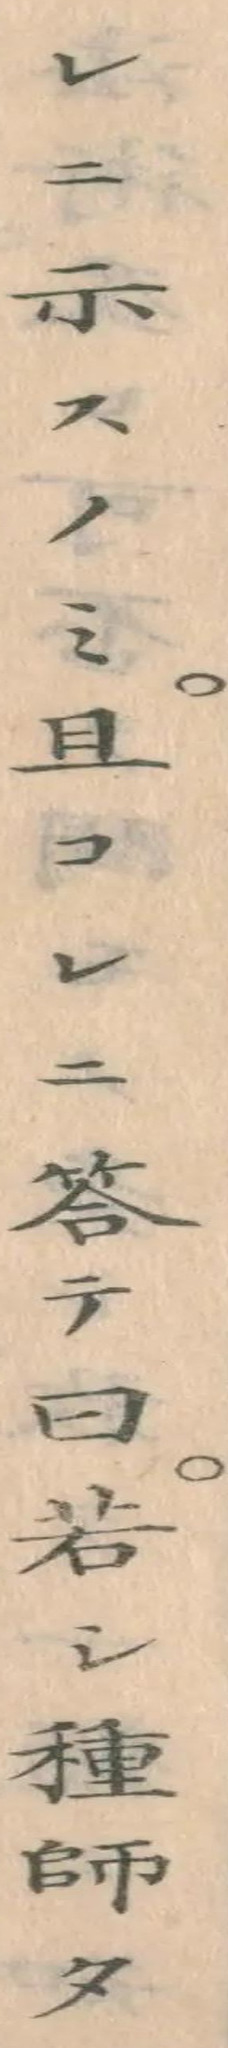レニ示スノミ。且コレニ答テ曰。若シ種師タ
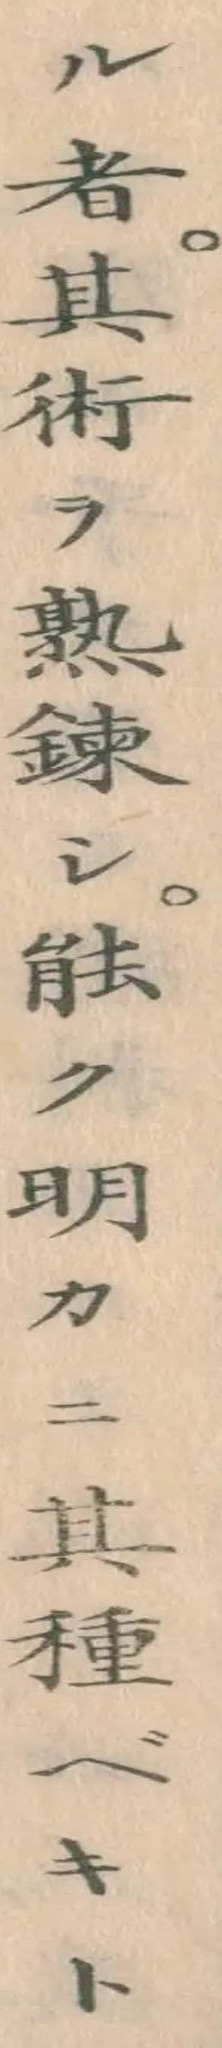ル者。其術ヲ熟練シ。能ク明カニ其種ベキト
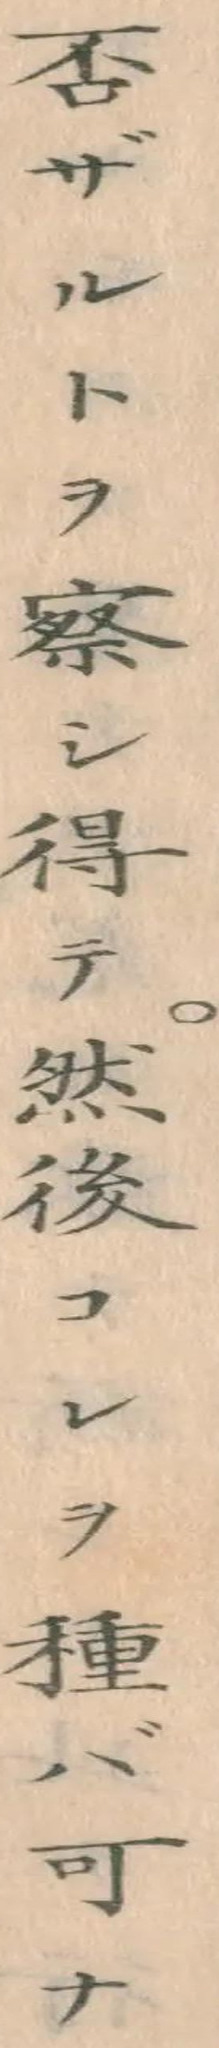否ザルトヲ察シ得テ。然後コレヲ種バ可ナ
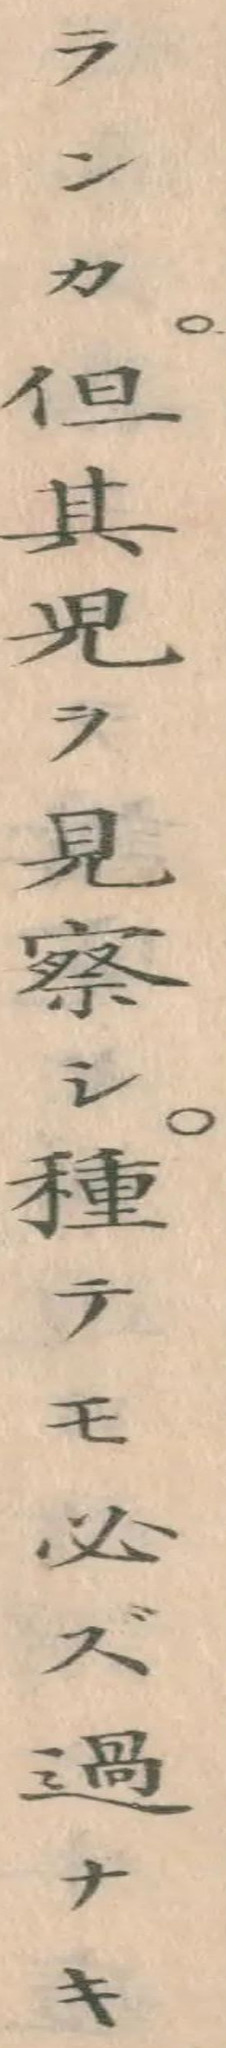ランカ。但其児ヲ見察シ。種テモ必ズ過ナキ
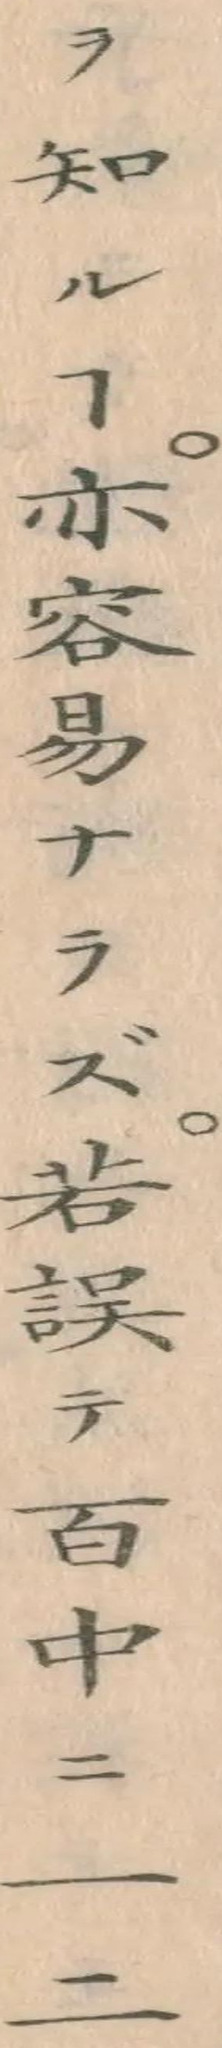ヲ知ルヿ。亦容易ナラズ。若誤テ百中ニ一二
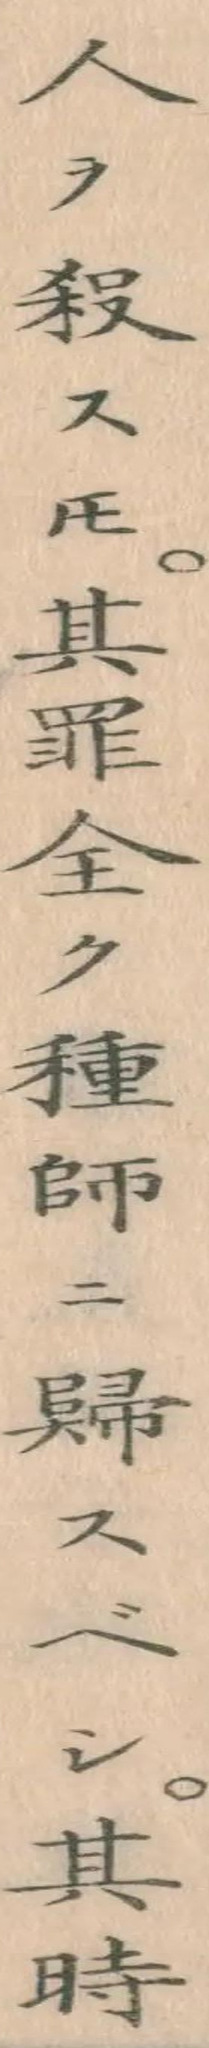人ヲ殺ス𪜈。其罪全ク種師ニ帰スベシ。其時
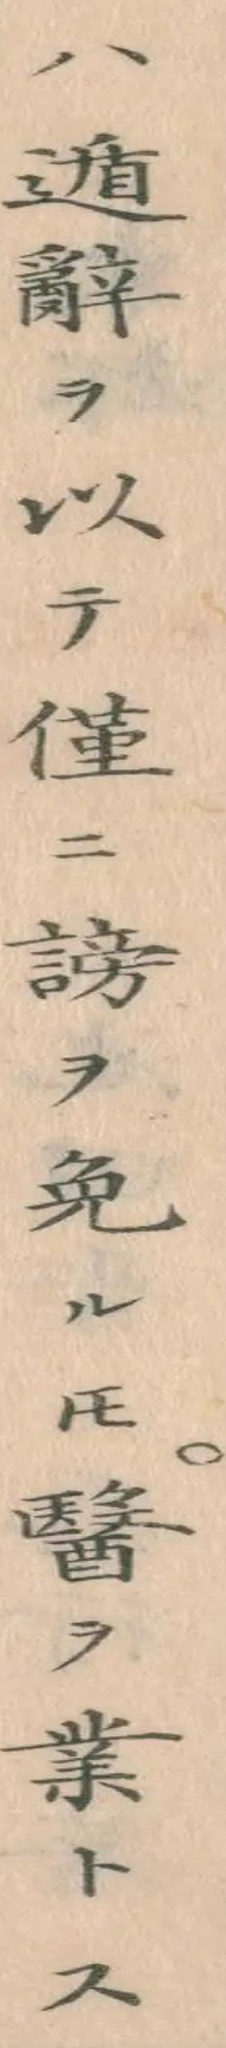ハ遁辞ヲ以テ僅ニ謗ヲ免ル𪜈。医ヲ業トス
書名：種痘弁義
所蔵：国立国会図書館 National Diet Library, JAPAN
